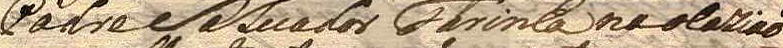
Padre Saluador Farinha na ocaziaõ
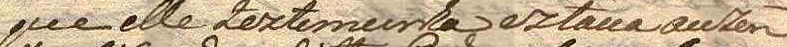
que elle teztemunha eztaua auzen
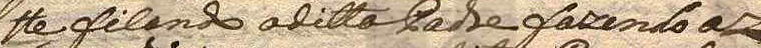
tte ficando o ditto Padre fazendo az
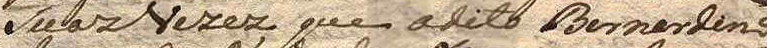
suaz Vezez, que o dito Bernardino
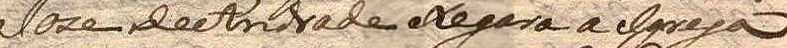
Ioze de Andrade Xegara a Igreja
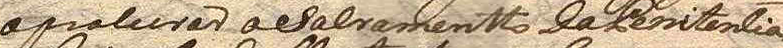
a procurar o Sacramentto da Penitencia
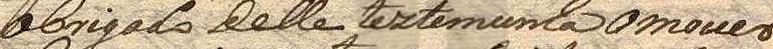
obrigado Delle teztemunha o mouer
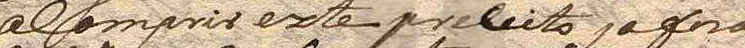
a Comprir ezte preceito ja fora
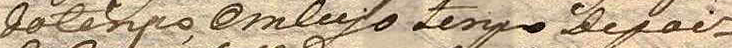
do tenpo, em cujo tenpo Depoiz
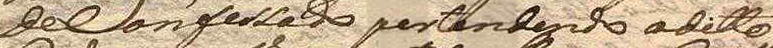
De confessado pertendendo o ditto
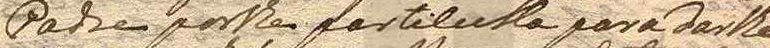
Padre porlhe particulla para darlhe
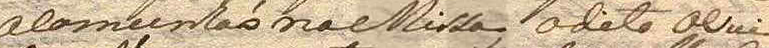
a comunhaõ na Missa, o dito ovui
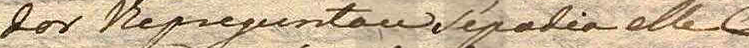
dor lhe preguntou se podia elle Co
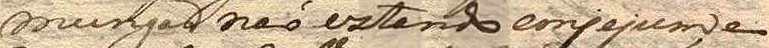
mungar naõ eztando em jejum, e
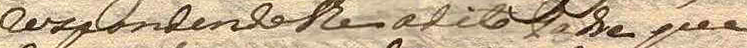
rezpondendolhe o dito Padre que
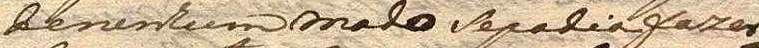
de nenhum modo se podia fazer
